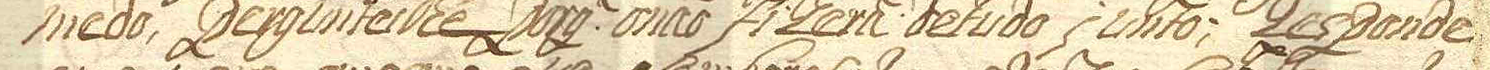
medo, Pergunteilhe porq̄ o não fizera de tudo junto; reponde
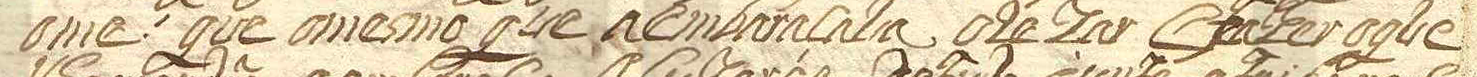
ome; que o mesmo que a embaraçava o rezar e fazer o que
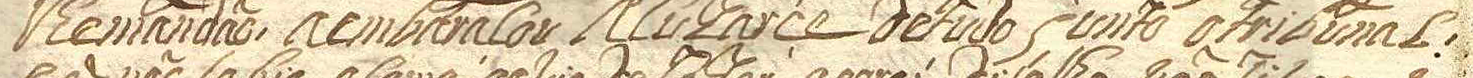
lhe mandaõ a embaraÇou ACuzarce de tudo junto o tribunal;
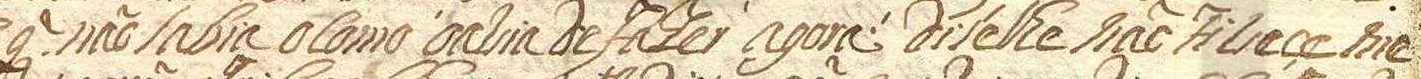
e q̄ não sabia o como o avia de fazer agora; diselhe naõ tivece me
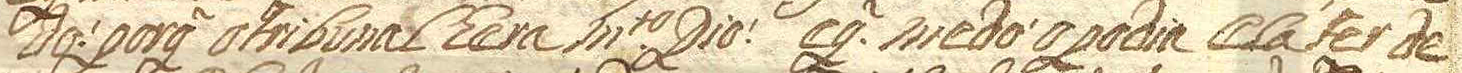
do porq̄ o tribunal hera mto pio: e q̄. medo o podia ela ter de
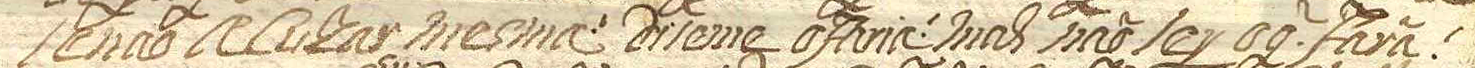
se naõ acuzar mesma: diseme o faria: mas naõ sey o q̄ fará!
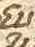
Eu
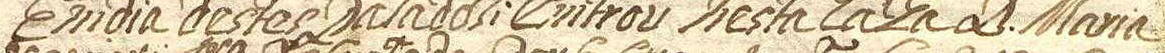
Em hu dia destes pasado si entrou nesta caza D. Maria
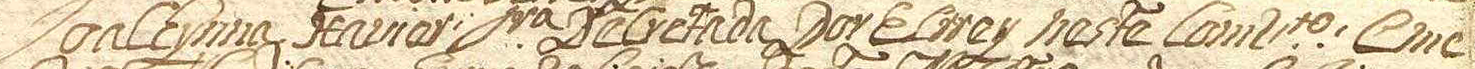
JoaChynnaa Havier S.ra Decretada por El rrey neste Comvt.o: e me
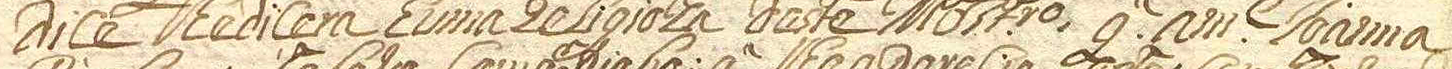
dice lhe dicera huma religioza deste Most.ro, q̄ a m.e Ioanna
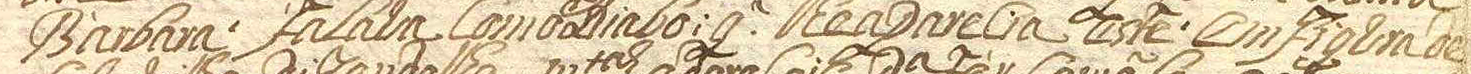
Barbara falava Com o Diabo: q̄ lhe aparecia este Em figura de
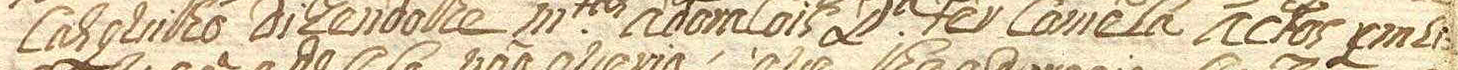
Casquilho dizendolhe m.tas adoraÇois P.a ter Com ēla actos emLi
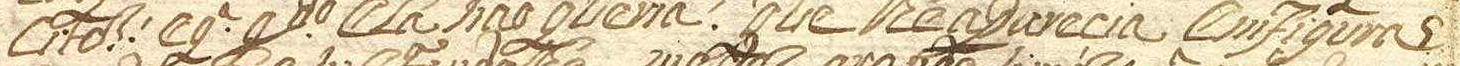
Citos; e q̄ q.do ela naõ queria: que lhe aparecia em figuras
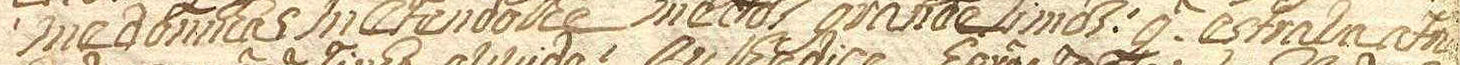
medonhas Metendolhe medos grandesimos: q̄ estrava ator
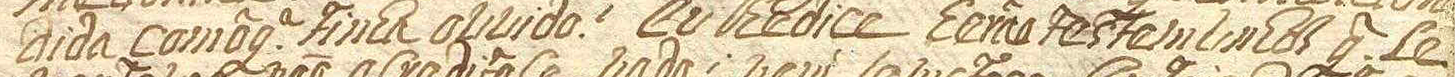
dida com o q.a tinha ouuido! Eu lhe dice herão testemunhos q̄ le
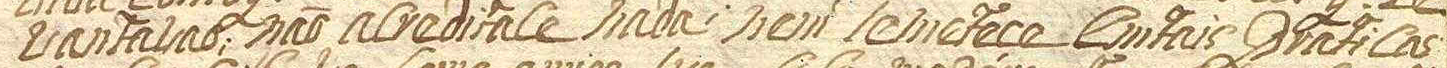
vantavaõ; naõ acreditace nada: nem se metece Em tais praticas
